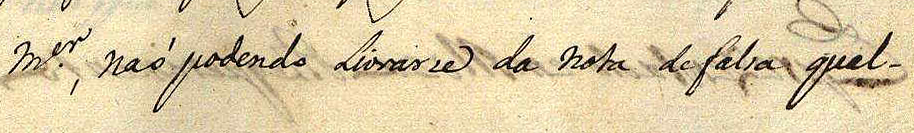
m.er, naõ podendo Livrarse da nota de falsa qual
